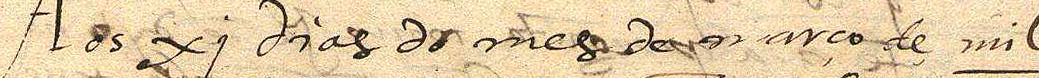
Aos xj dias do mes de março de mil
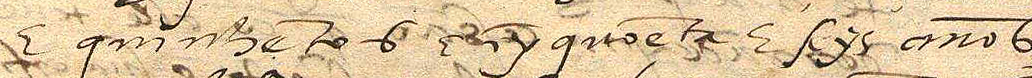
E quinhētos E cȳquōeta E seys an̄os
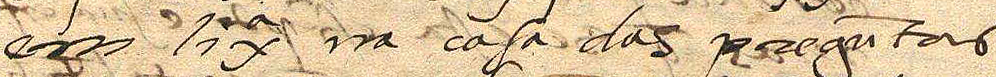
em lixa na casa das pregūtas
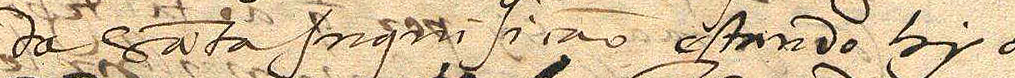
da Sāta Jnquisicão estando hy o
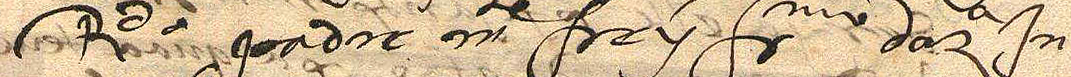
Rdo padre mte frey Jrmo daza Jn
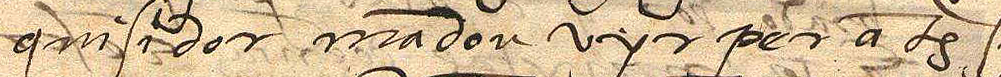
quisidor mādou vyr ꝑerātꝭ sy
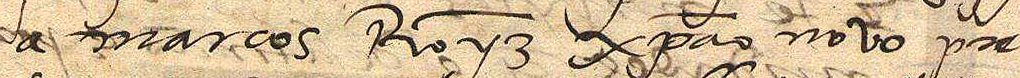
a marcos Rōyz xpão novo pre
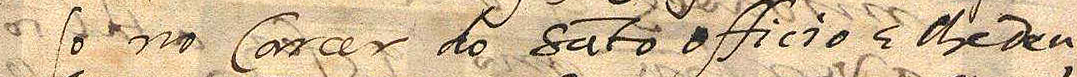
so no Carcer do Sāto officio E lhe deu
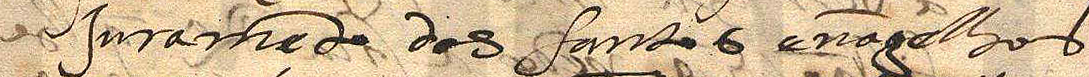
Juramēto dos santos euāgelhos
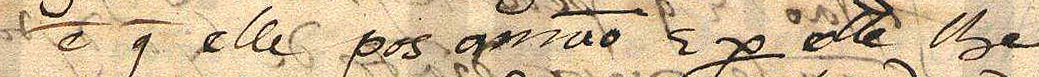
ē q̄ elle pos a mão E ꝑ elle lhe
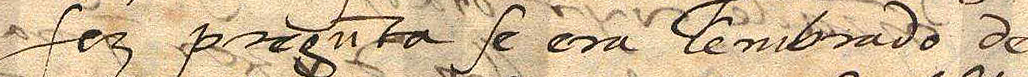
fes pregūta se era lembrado de
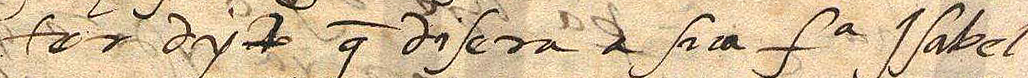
ter dyto q̄ disera a sua fa Jsabel
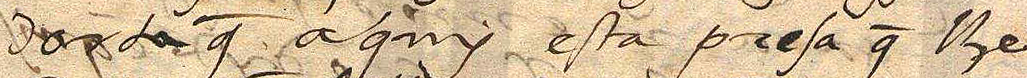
dorta q̄ aquy esta presa q̄ lhe
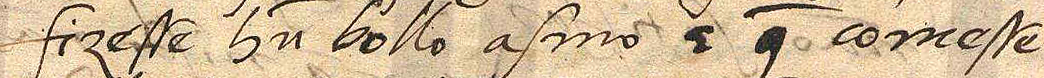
fizesse hū bollo asmo e q̄ comesse
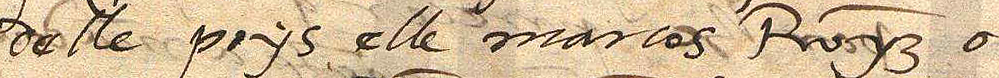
delle poys elle marcos Rōyz o
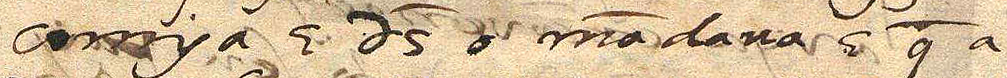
comya E ds̄ o mādaua E q̄ a
